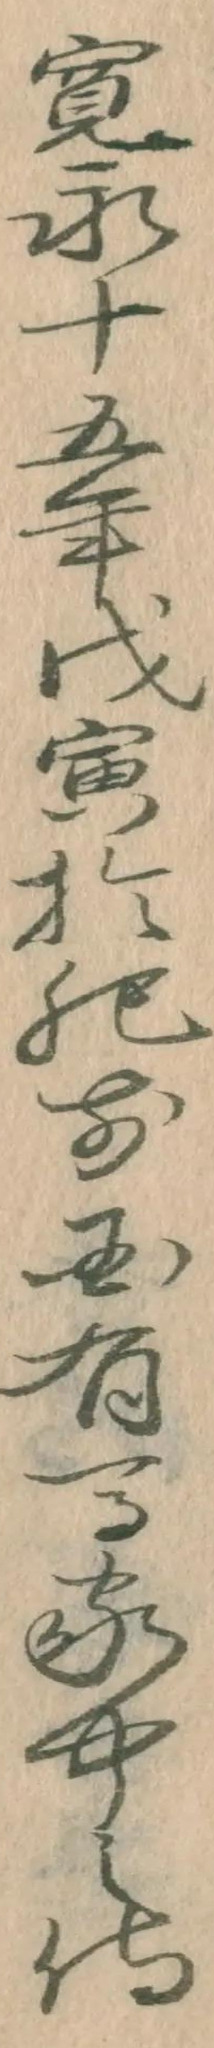寛永十五年戌寅於肥前国有馬家中之侍
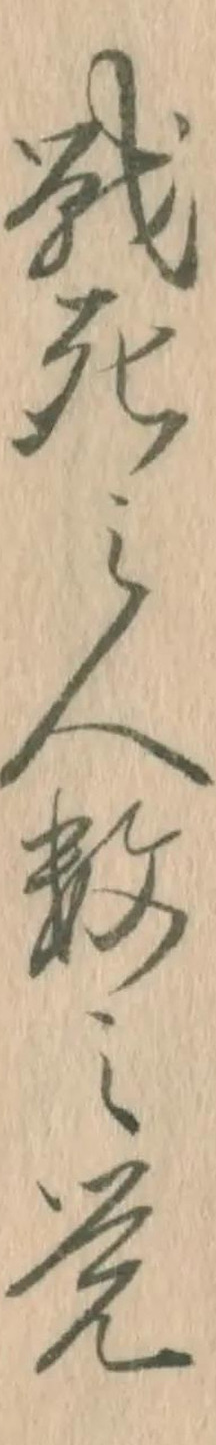戦死之人数之覚
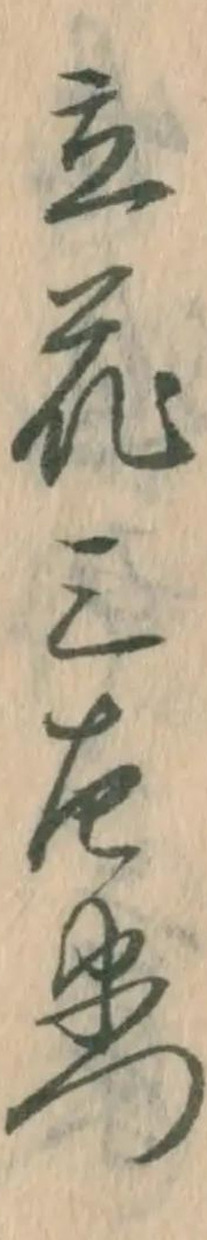立花三左衛門
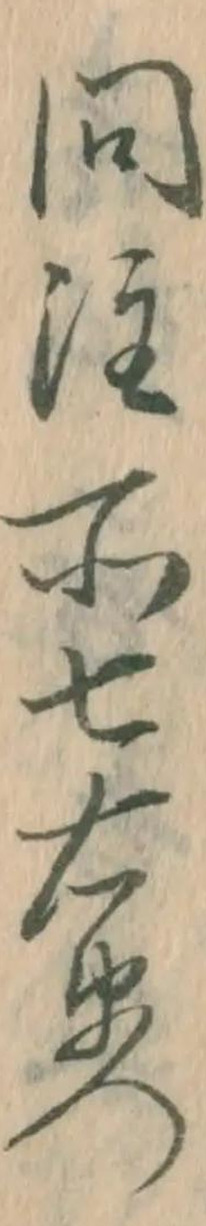問注所七右衛門

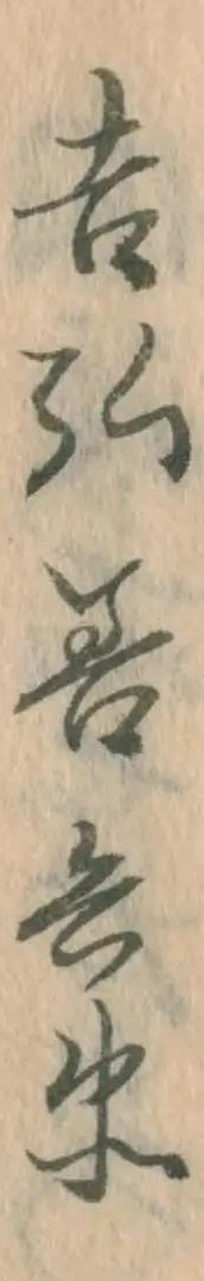吉弘善兵衛
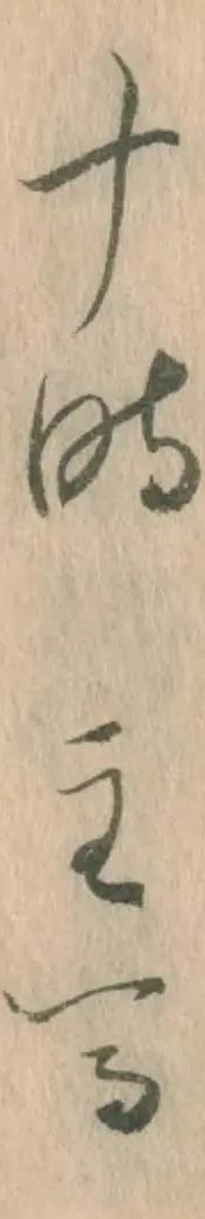十時主馬
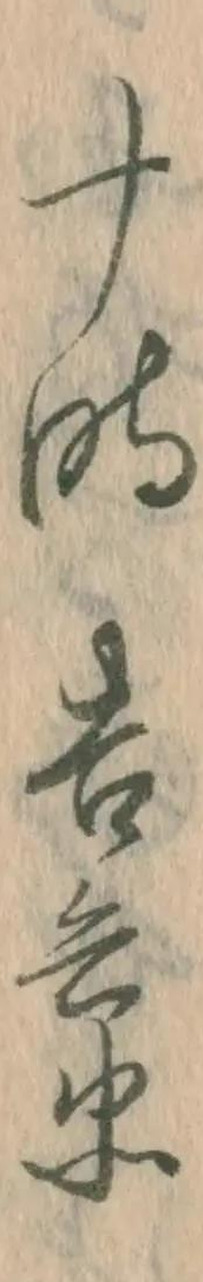十時吉兵衛
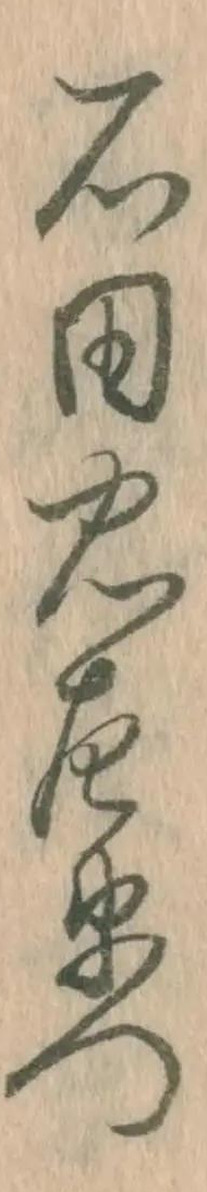石田忠左衛門
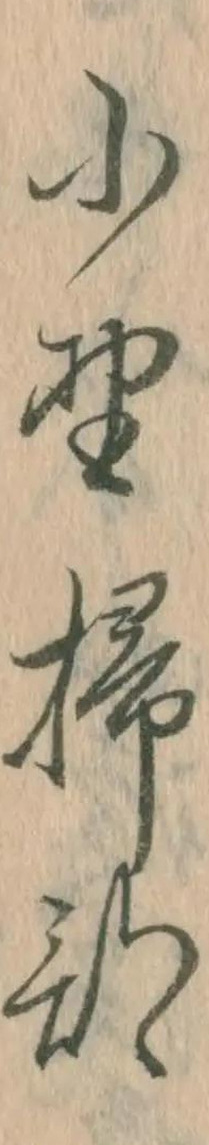小野掃部
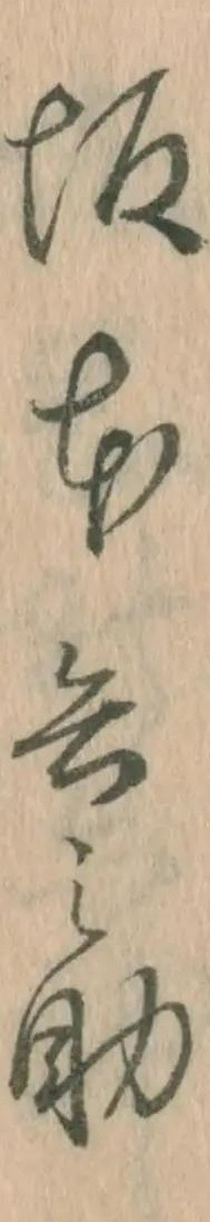坂本兵之助
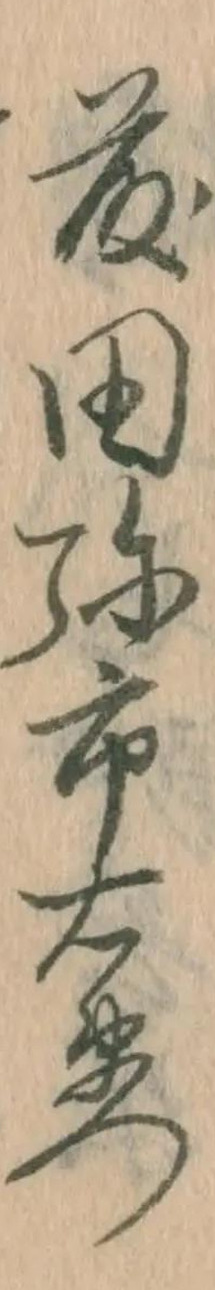藤田弥市右衛門
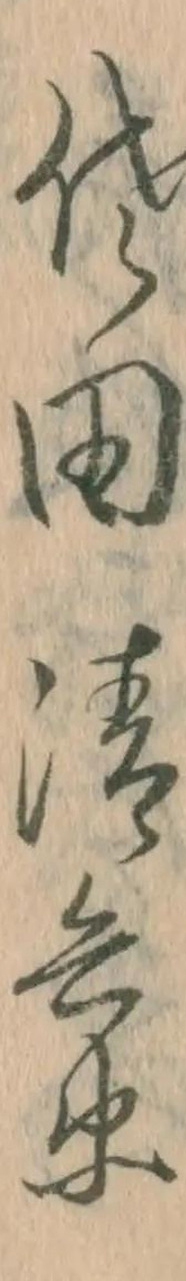佐田清兵衛
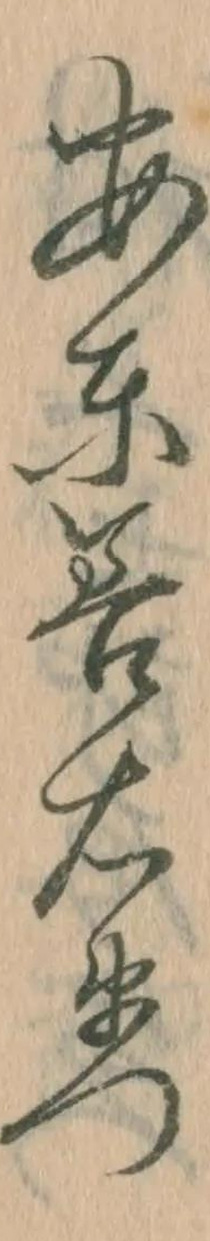安東前右衛門
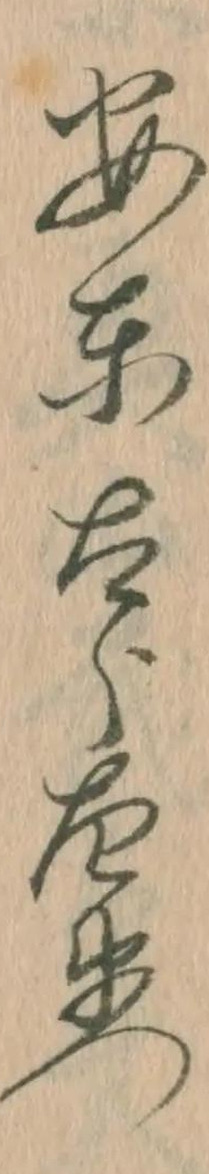安東太郎左衛門
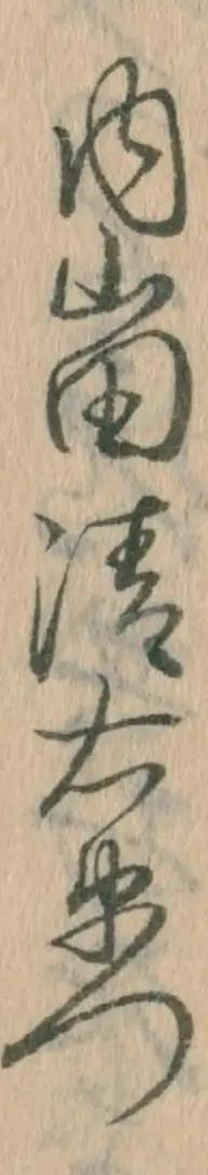内山田清右衛門
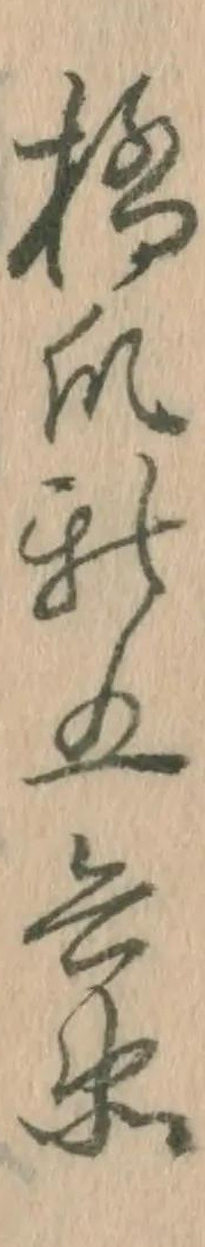橋爪新五兵衛
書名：切支丹御退治記 49巻. [9]
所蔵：国立国会図書館 National Diet Library, JAPAN
